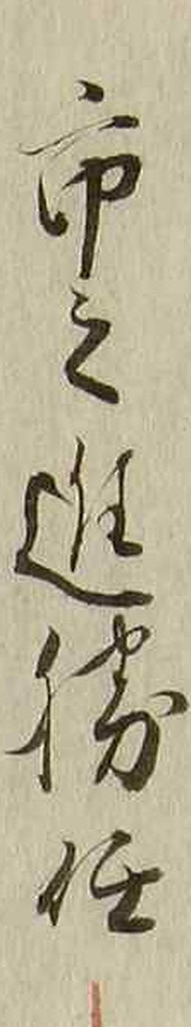市之進勝任
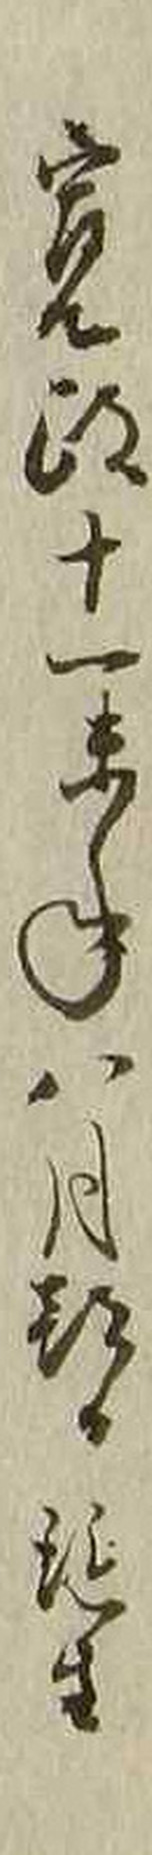寛政十一未年八月朔日誕生
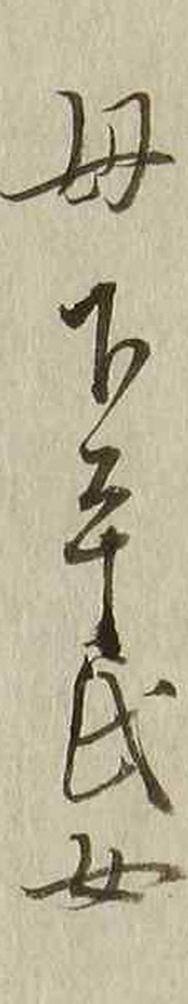母下平氏女
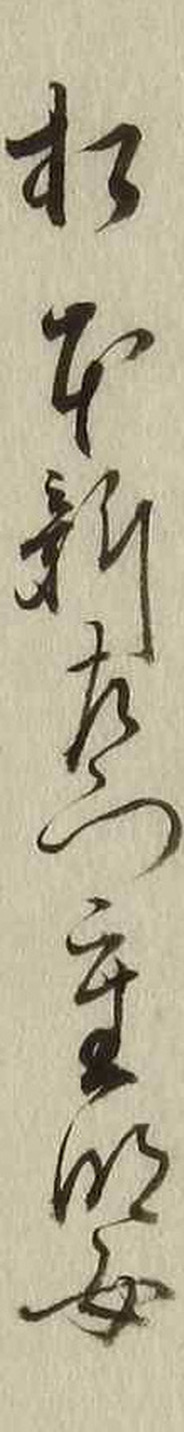松本新左衛門重明女
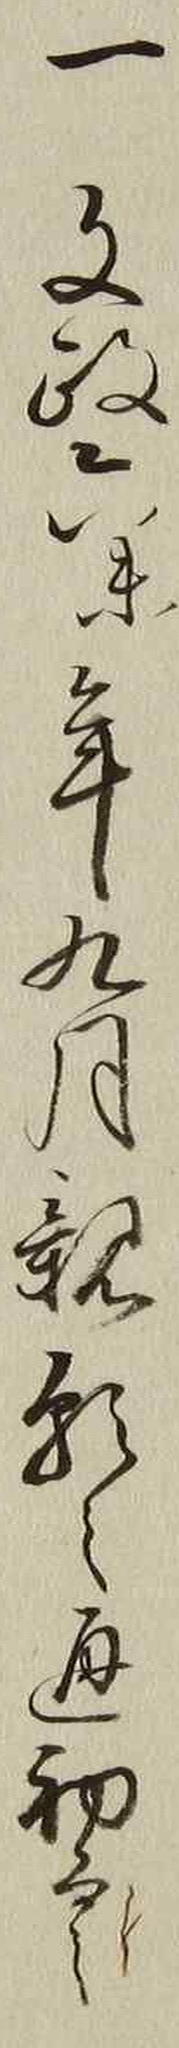一文政六未年九月親願い之通初めて之
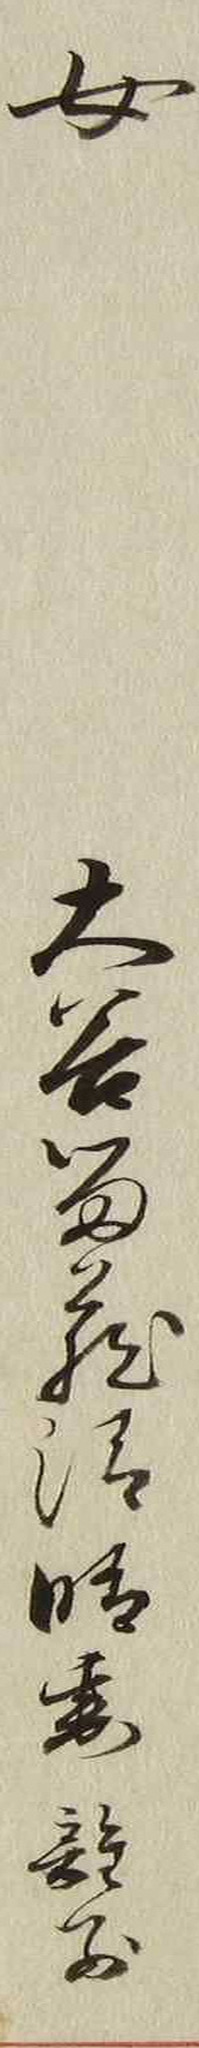女大谷留蔵清時妻離別
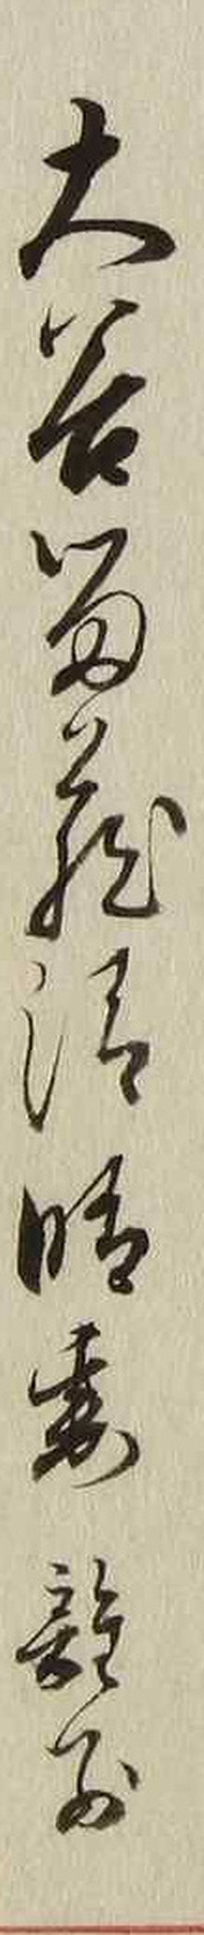女大谷留蔵清時妻離別
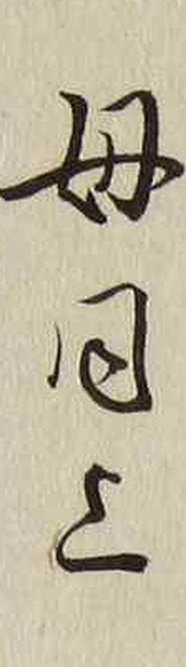母同上

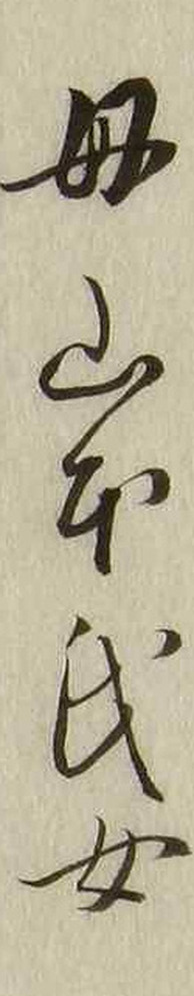母山本氏女
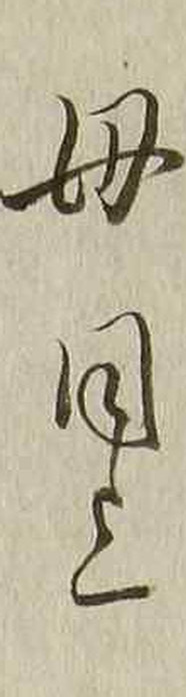母同上
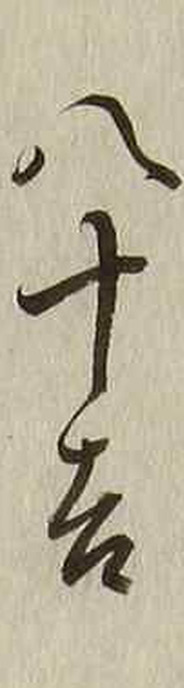八十吉
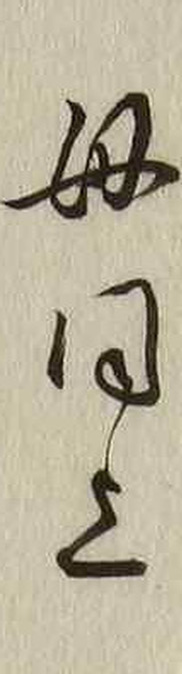母同上
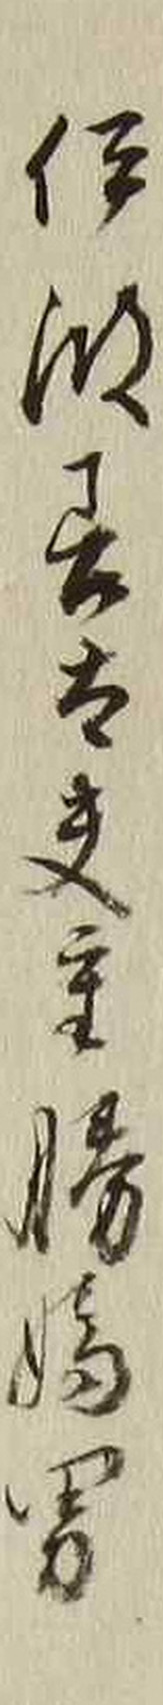伊波善太夫重陽嫡男
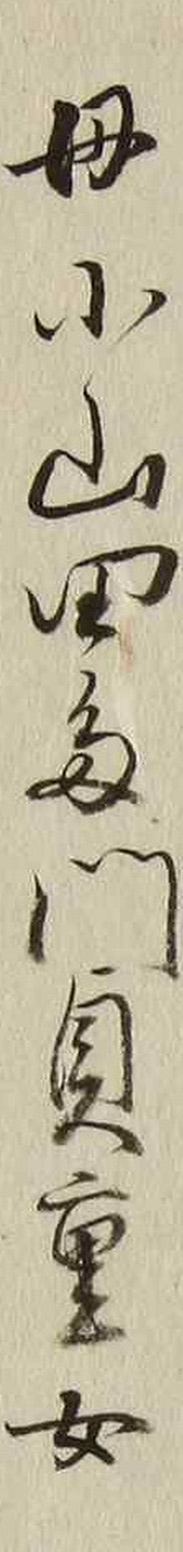母小山田多門貞重女
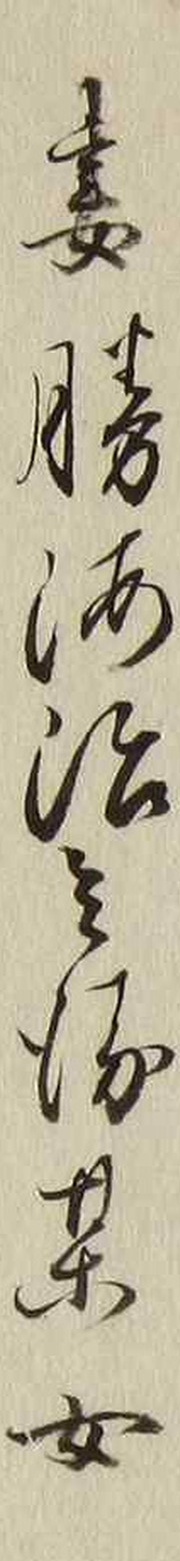妻勝海治兵衛某女

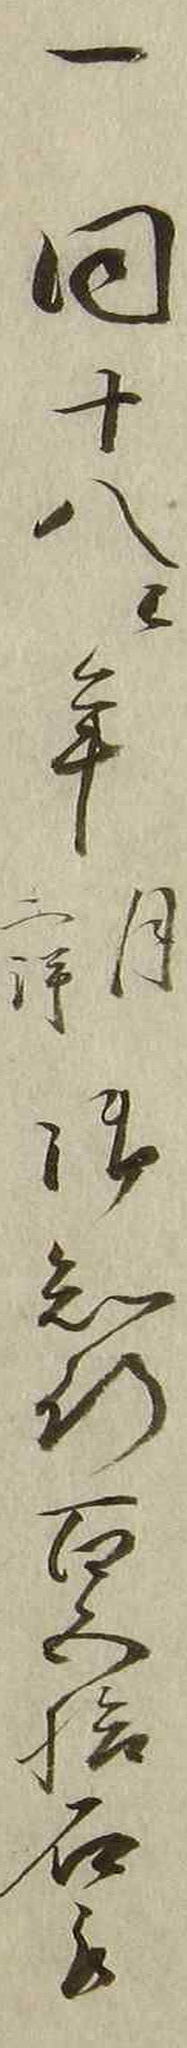一同十八巳年月不詳御知行百五拾石
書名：諸士系譜　巻之20　い之部20
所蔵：会津若松市立会津図書館
